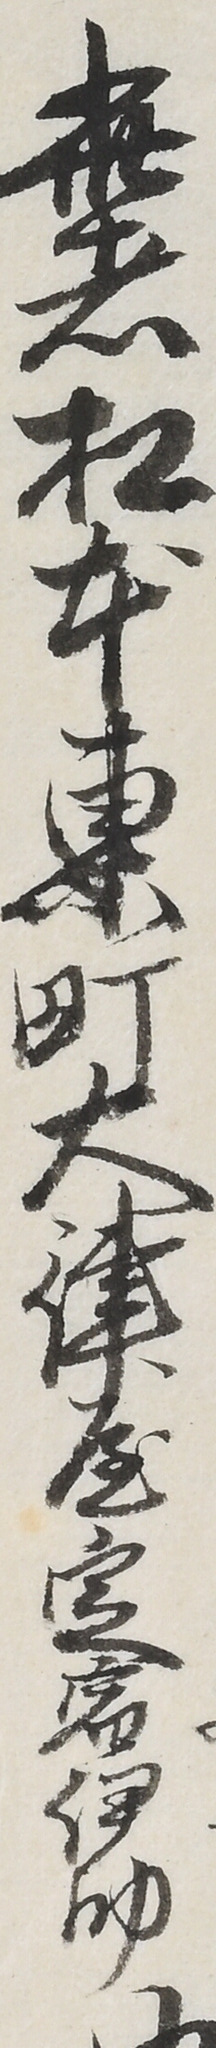此者松本東町大津屋定宿伊助
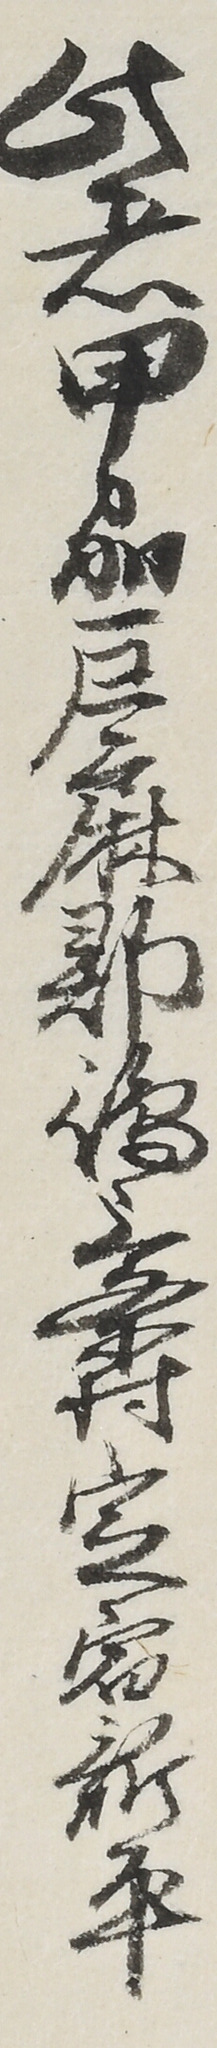此者甲州巨摩郡島上条村定宿新平
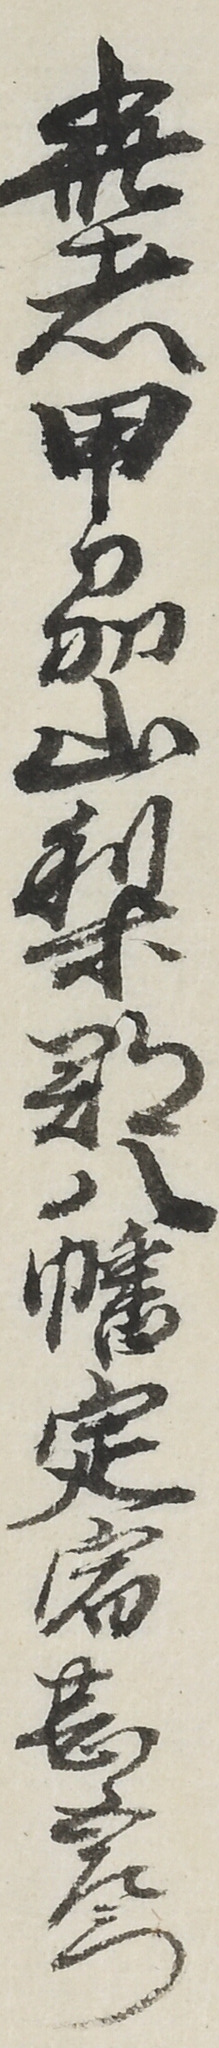此者甲州山梨郡八幡定宿甚五左衛門

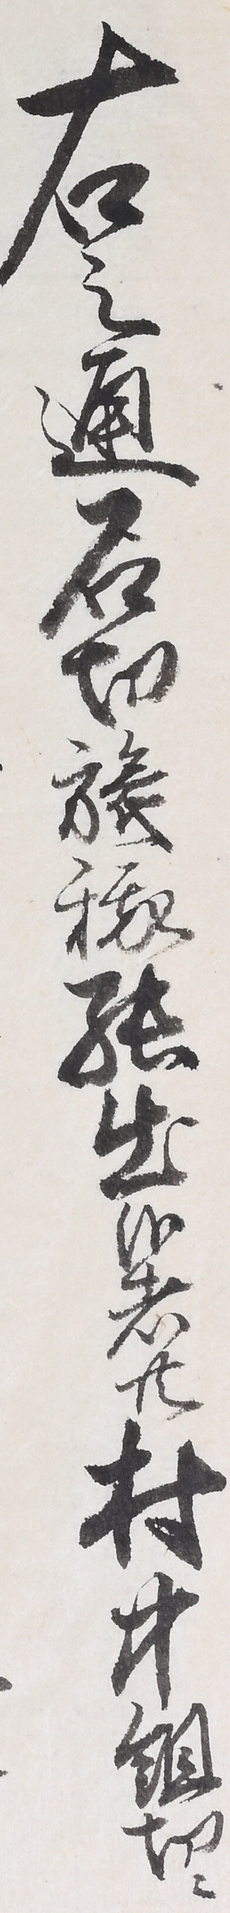右之通石切旅稼罷出候者共村中組切ニ
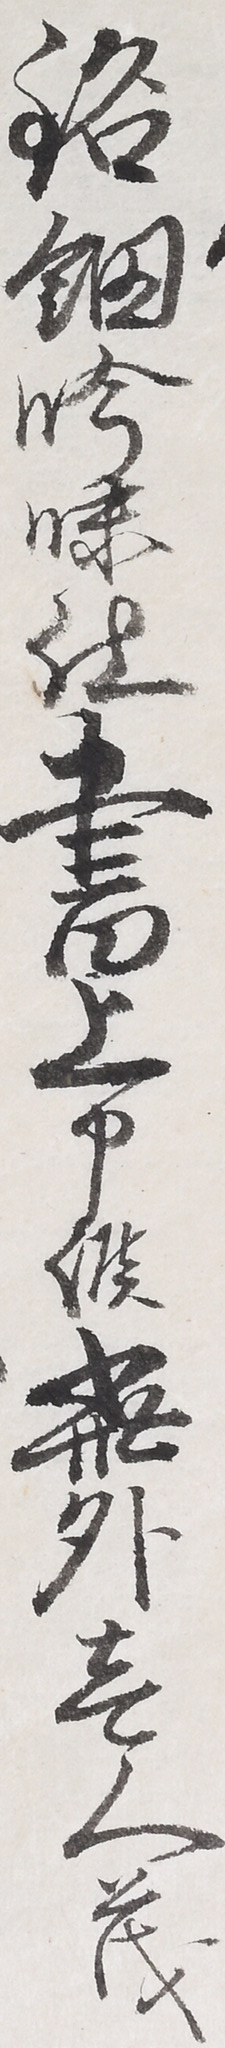銘細吟味仕書上申候此外壱人茂
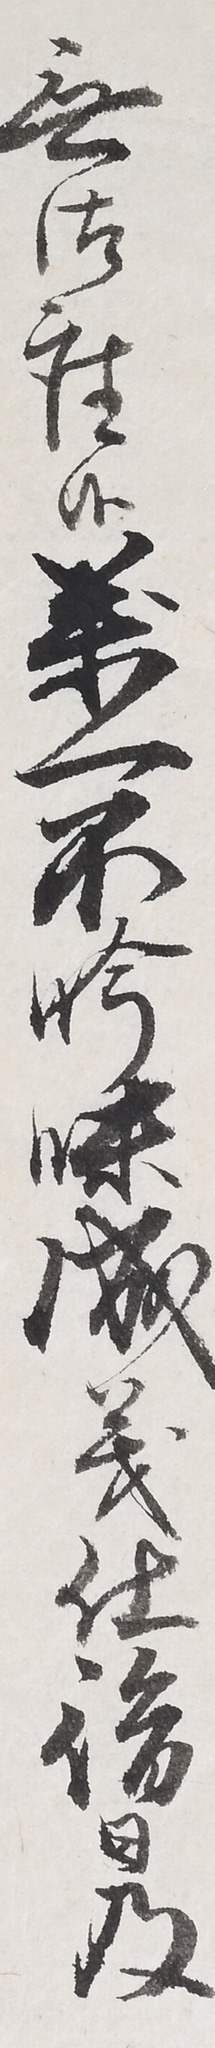無御座候万一不吟味成義仕後日及
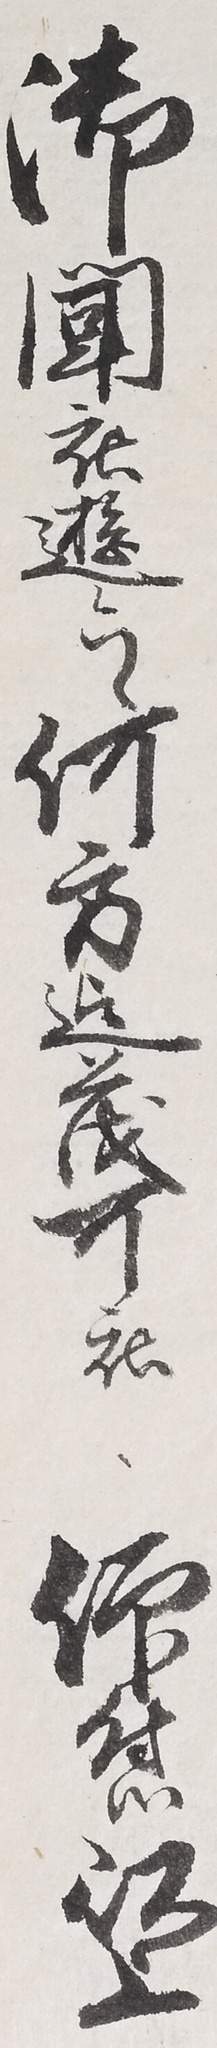御聞被遊候ハヽ何方迄茂可被仰付候以上
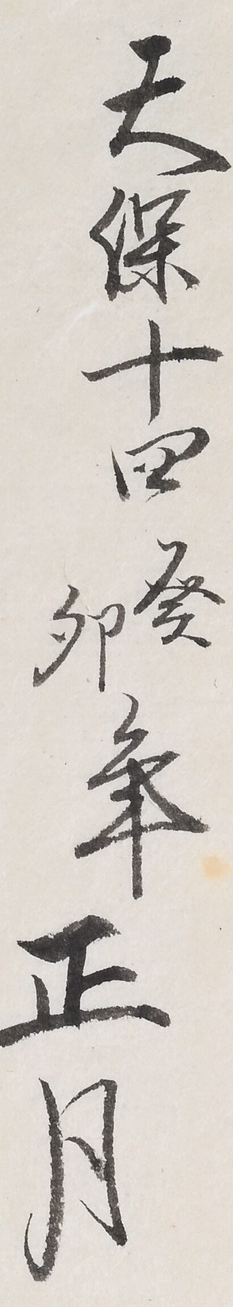天保十四癸卯年正月
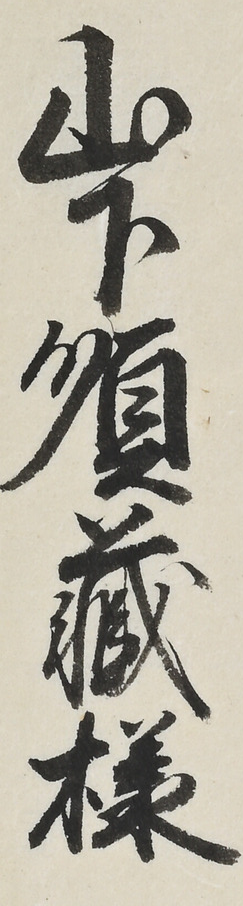山下順蔵様
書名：天保十四癸卯年正月他國出石切名前書上帳控
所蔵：伊那市立高遠町図書館・合同会社AMANE
